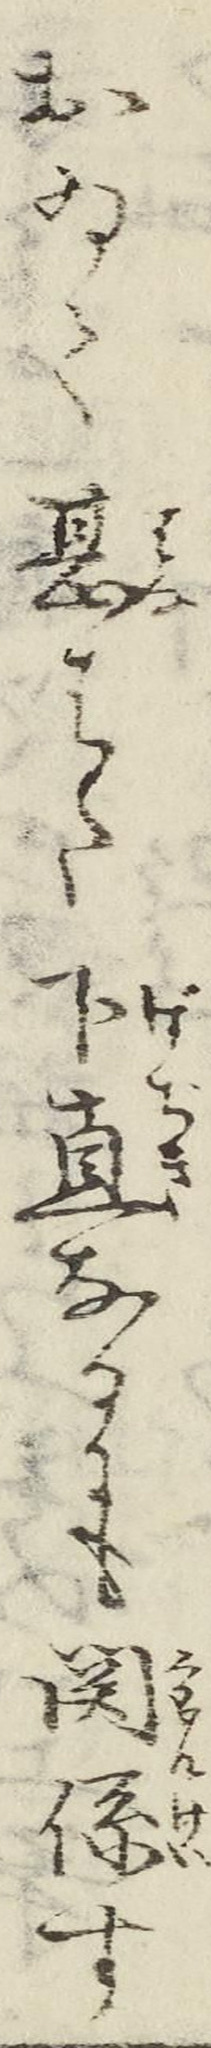おゐて甚はた下直なるにも関係す
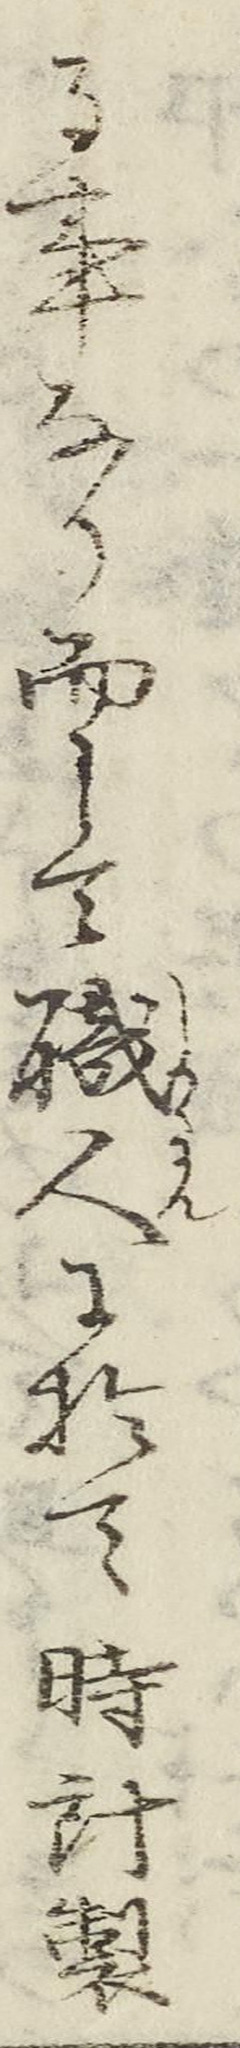る事なり而して職人に於て時計製
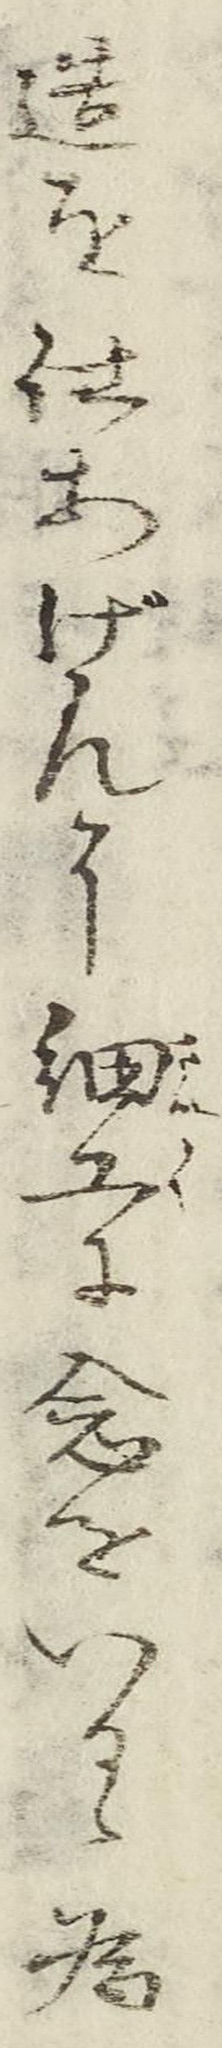造を仕あげんに細工に念をいるゝ為
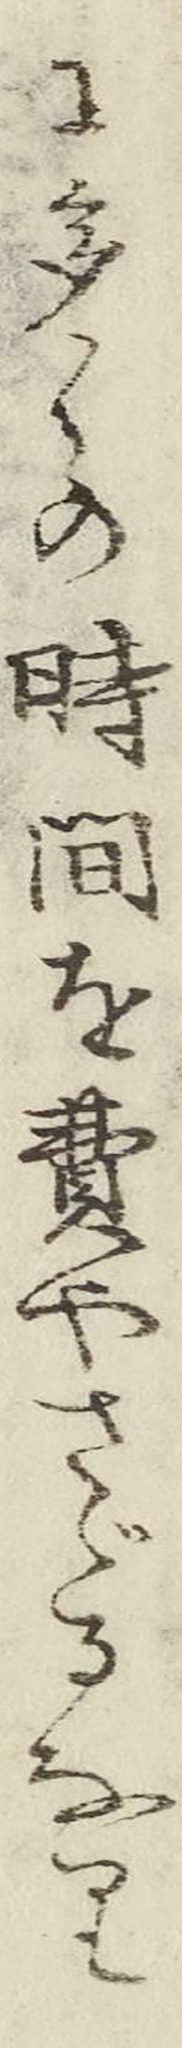に多くの時間を費やさゞるなり
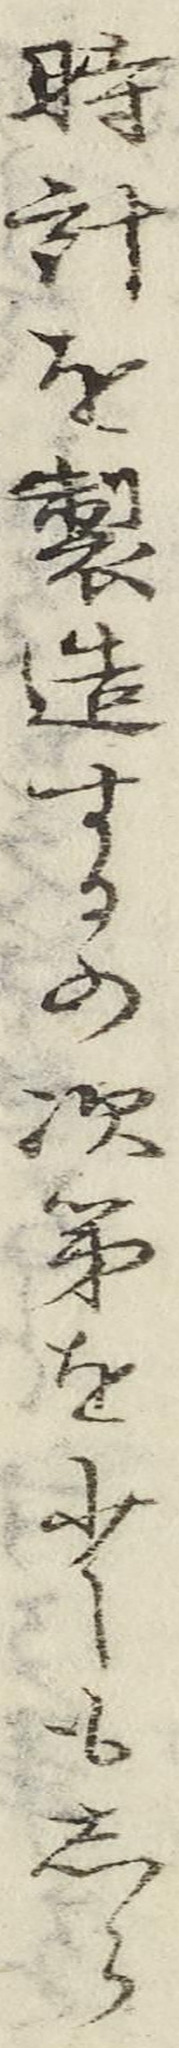時計を製造するの次第を少しもしら
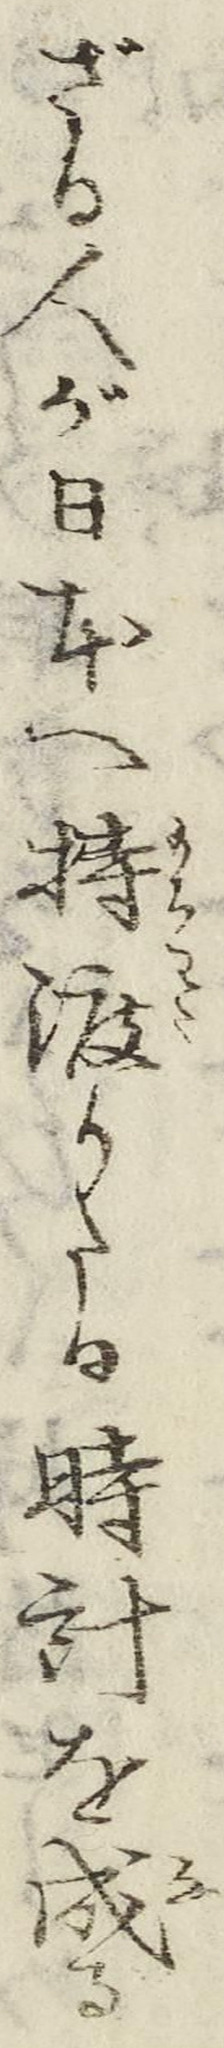ざる人が日本へ持渡りたる時計を成る
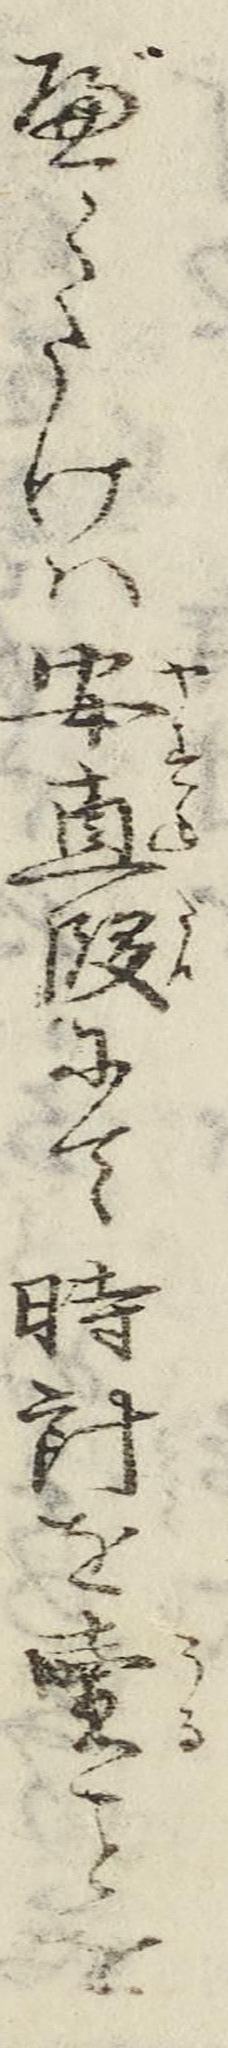べくたけは安直段にて時計を売ことを
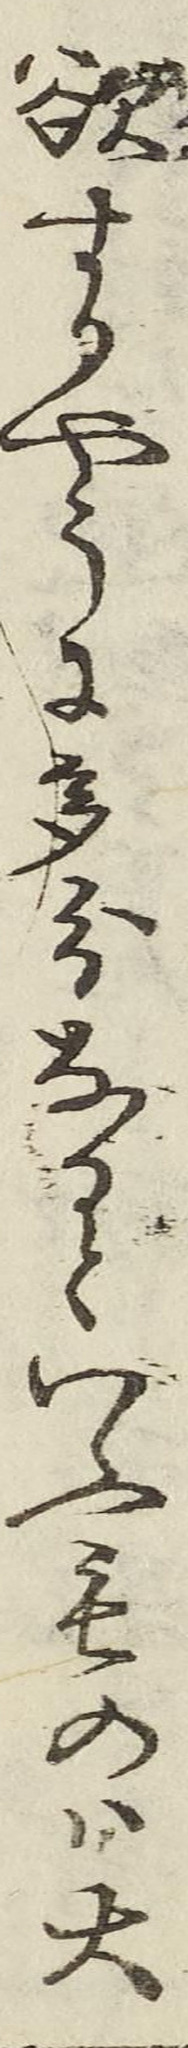欲するやうに多分なるといふものは大
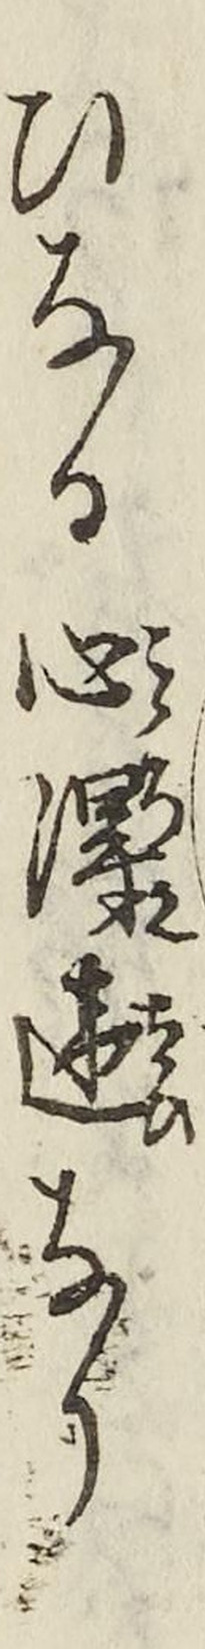ひなる心得違なり
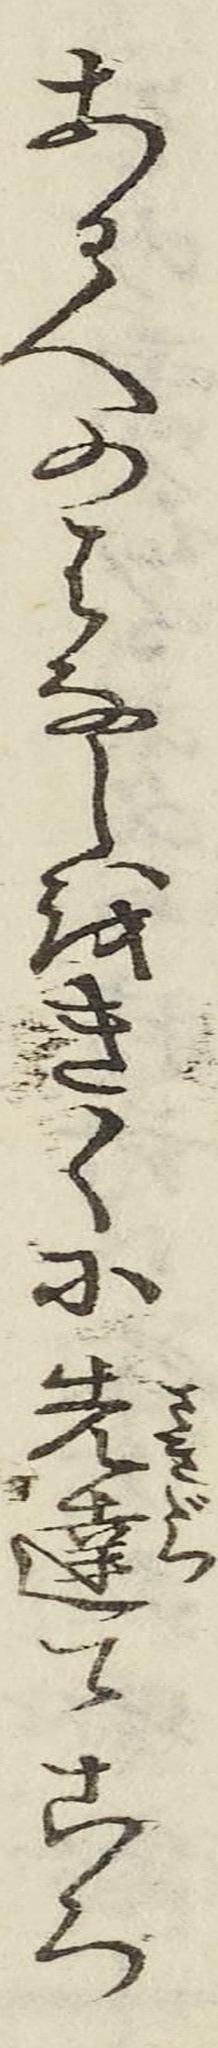ある人のはなしをきくに先達てころ
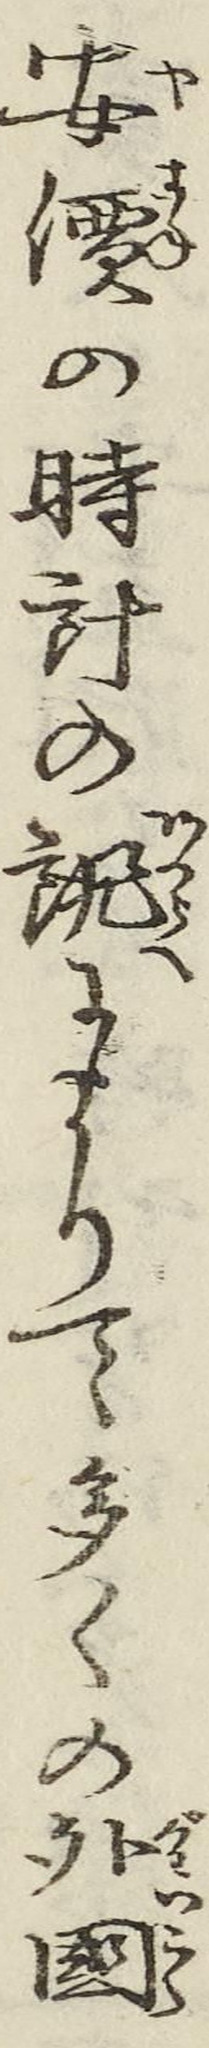安価の時計の誂によりて多くの外国
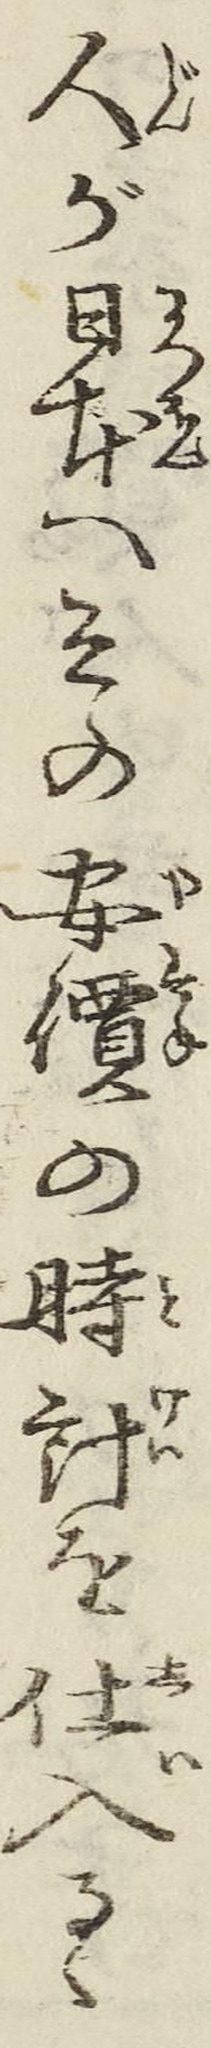人が日本へその安価の時計を仕入るゝ
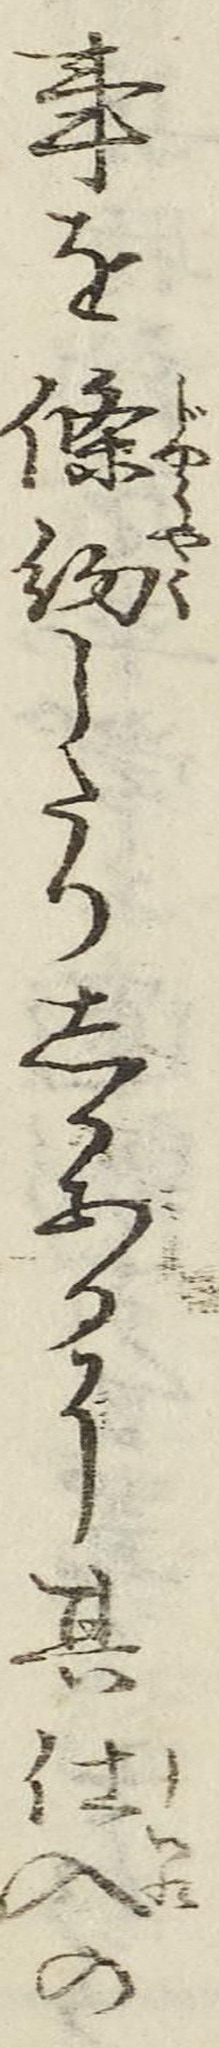事を条約したりしかあるに其仕入の
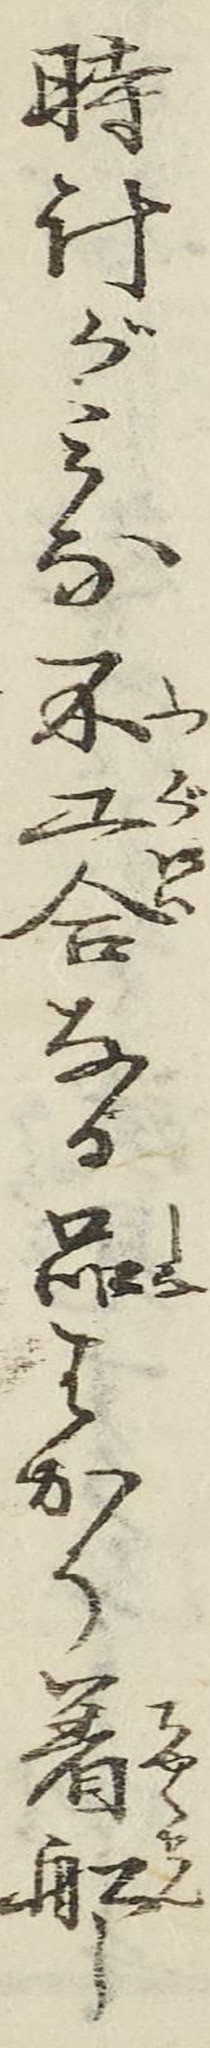時計がみな不工合なる品はかり着船し
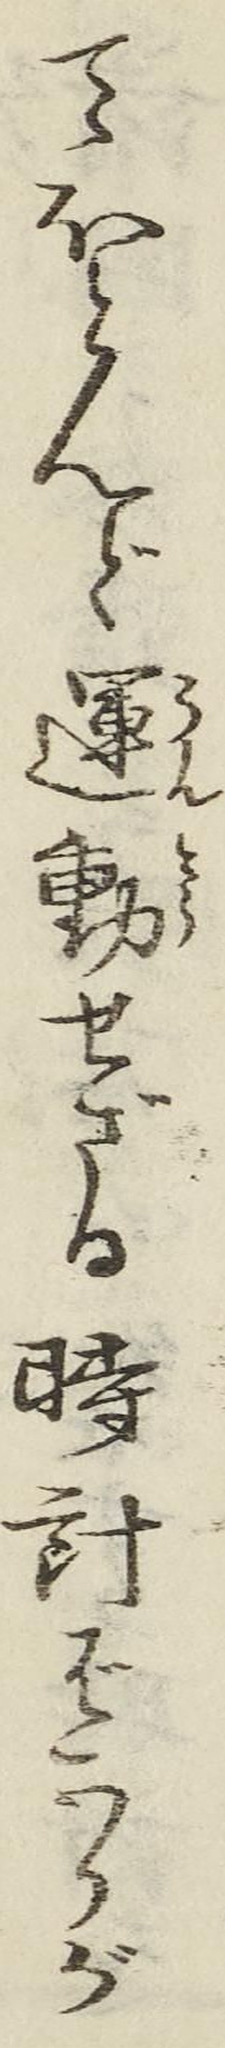てほとんど運動せざる時計ばかりが
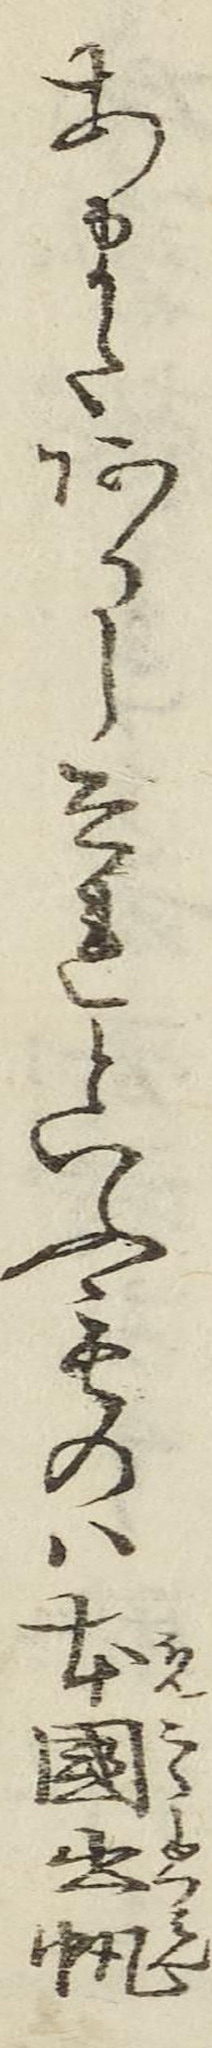あまたありしそれといふものは本国出帆
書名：[時計に関する冊子]
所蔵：東京大学地震研究所図書室 Earthquake Research Institute Library, The University of Tokyo, JAPAN
